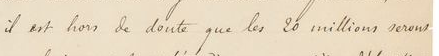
il est hors de doute que les 20 millions seront
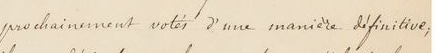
prochainement votés d'une manière définitive;
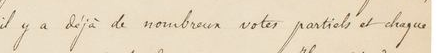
il y a déjà de nombreux votes partiels et chaque
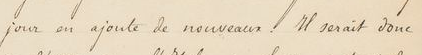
jour on ajoute de nouveaux. Il serait donc
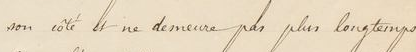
son côté et ne demeure pas plus longtemps
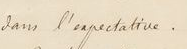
dans l'expectative.
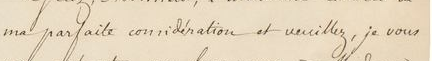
ma parfaite considération et veuillez, je vous
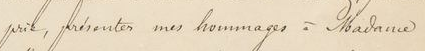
prie, présenter mes hommages à Madame
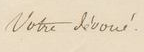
Monsieur Correnti.
